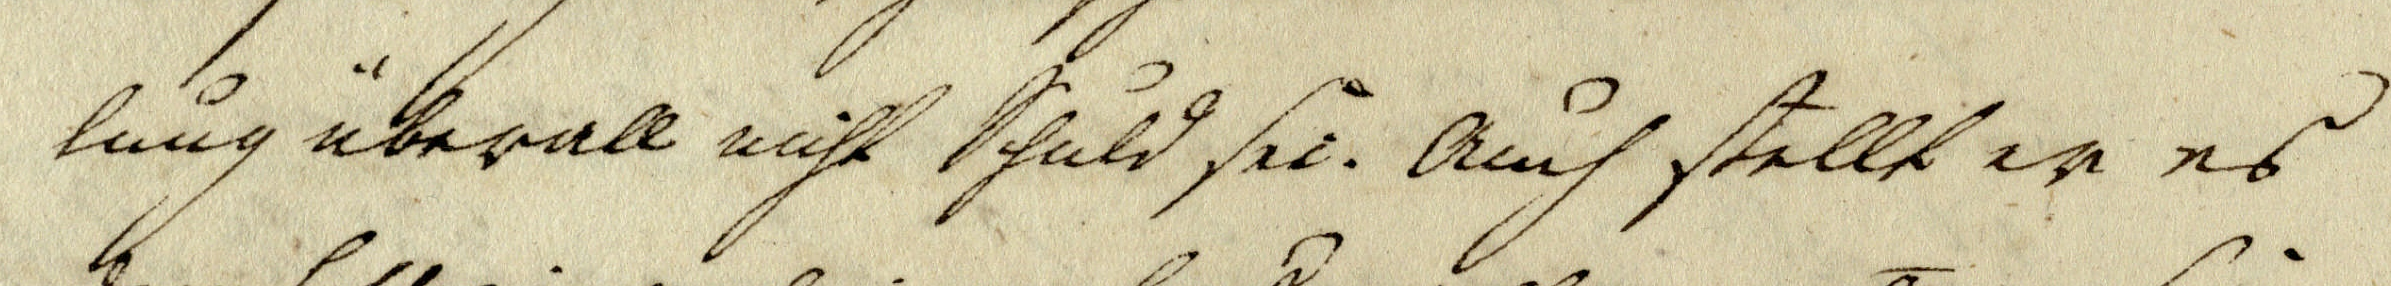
lung überall nicht Schauld sei. Auch stellet er es
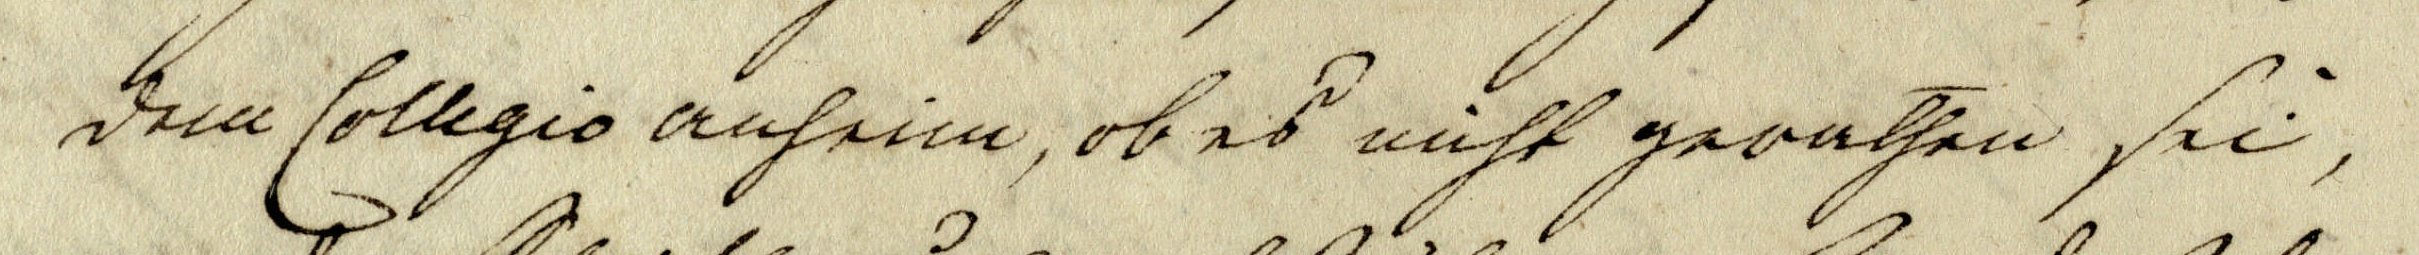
dem Collegio anheim, ob es nicht gerathen sei,
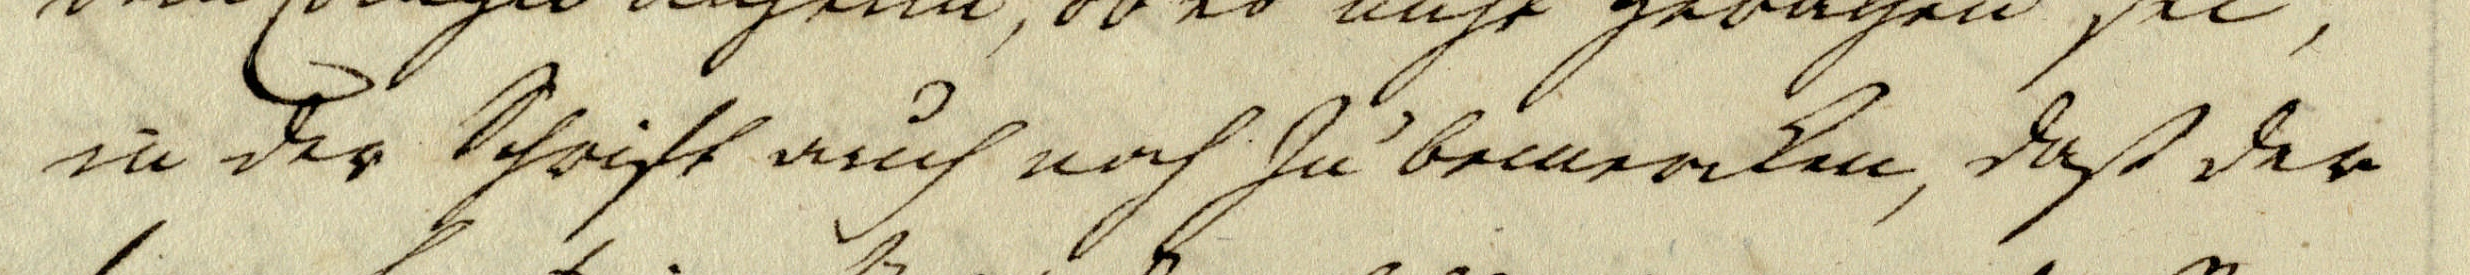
in der Schrift auch noch zu bemercken, daß der
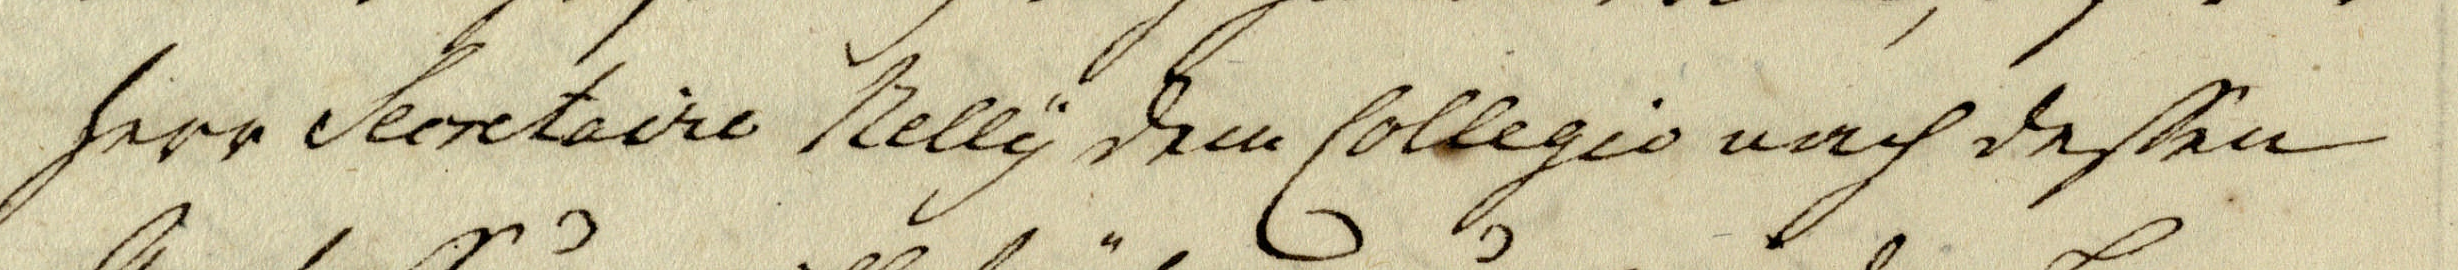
Herr Secretaire Nellÿ dem Collegio nach dessen
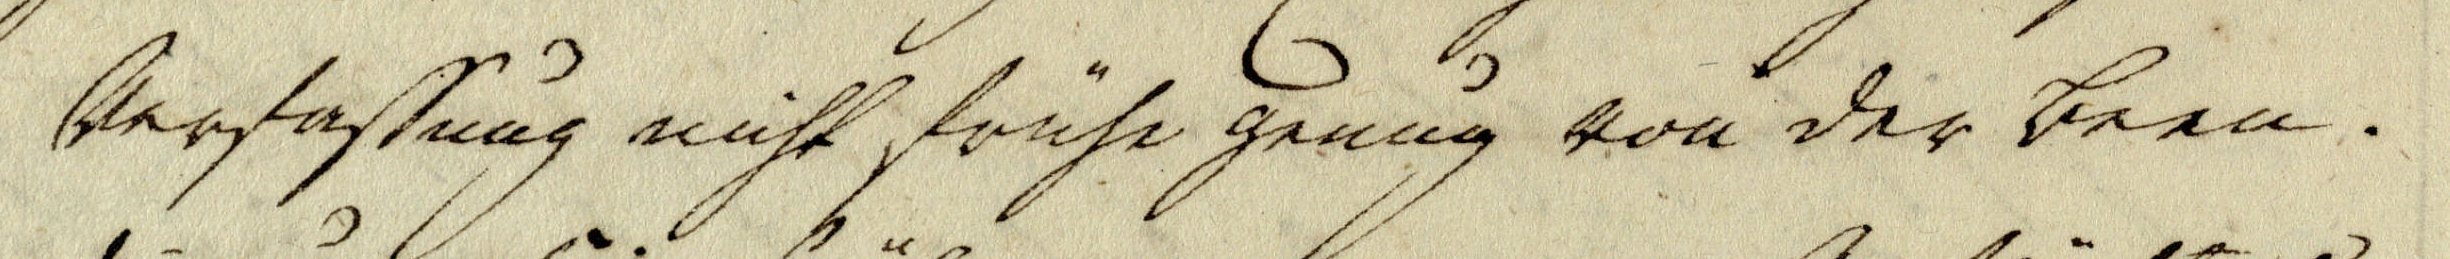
Verfassung nicht frühe genug von der Been¬
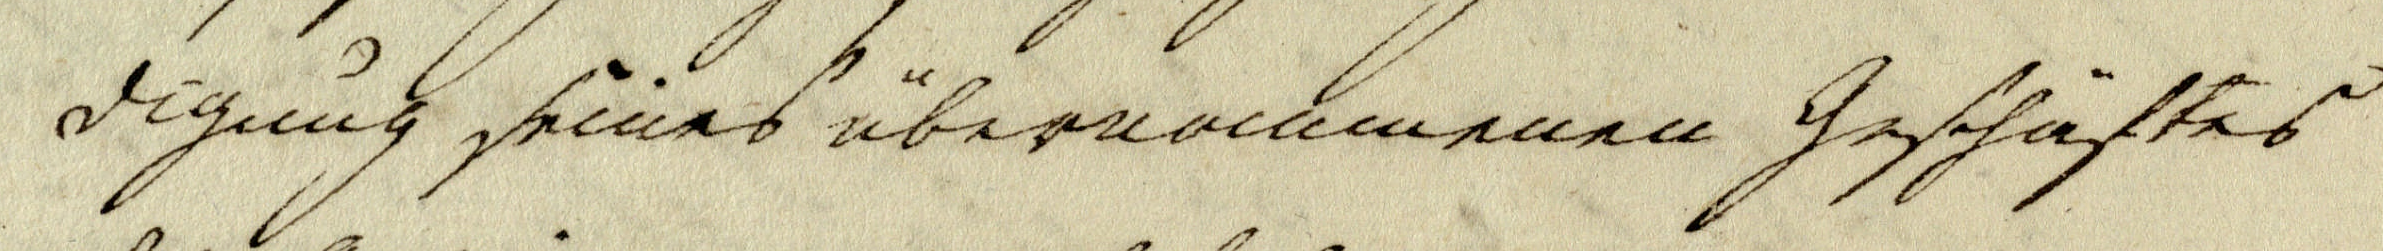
digung seines übernommenen Geschäftes
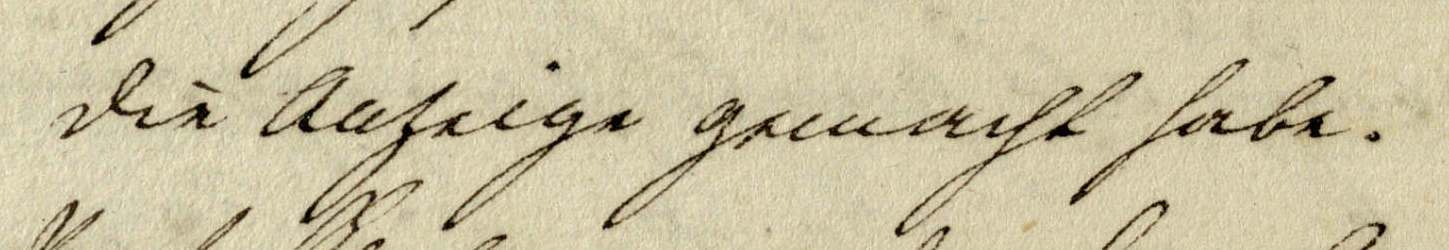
die Anzeige gemacht habe.
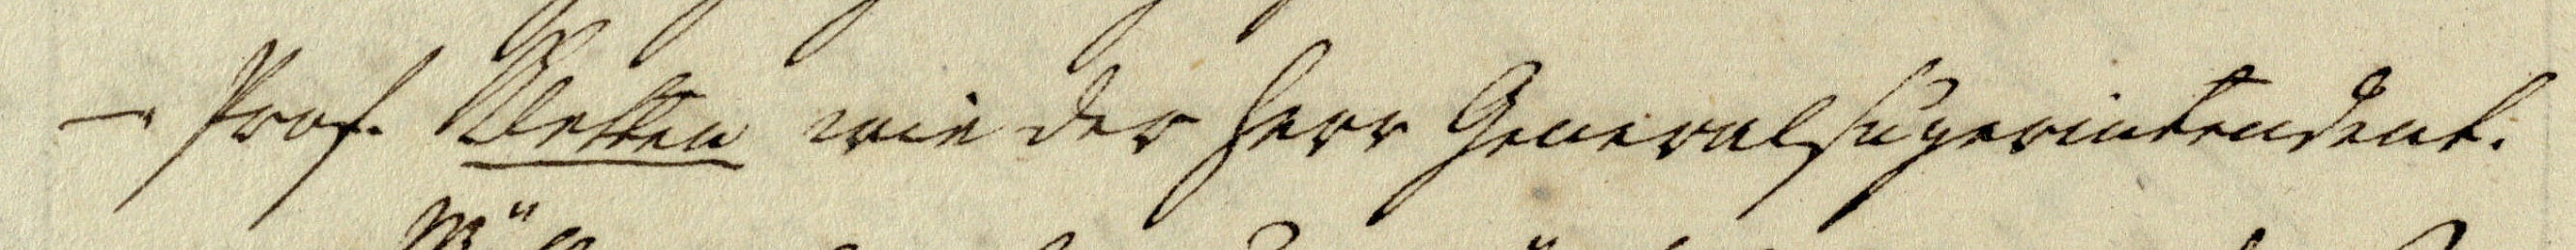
Prof. Kletten wie der Herr Generalsuperintendent.
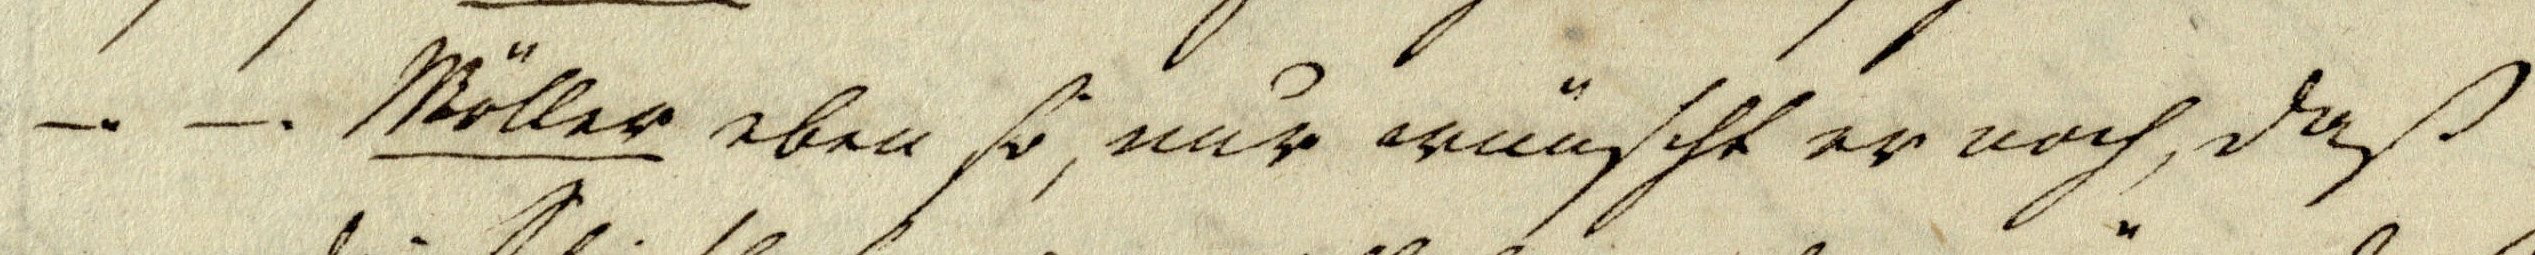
Möller eben so, nur wünscht er noch, daß
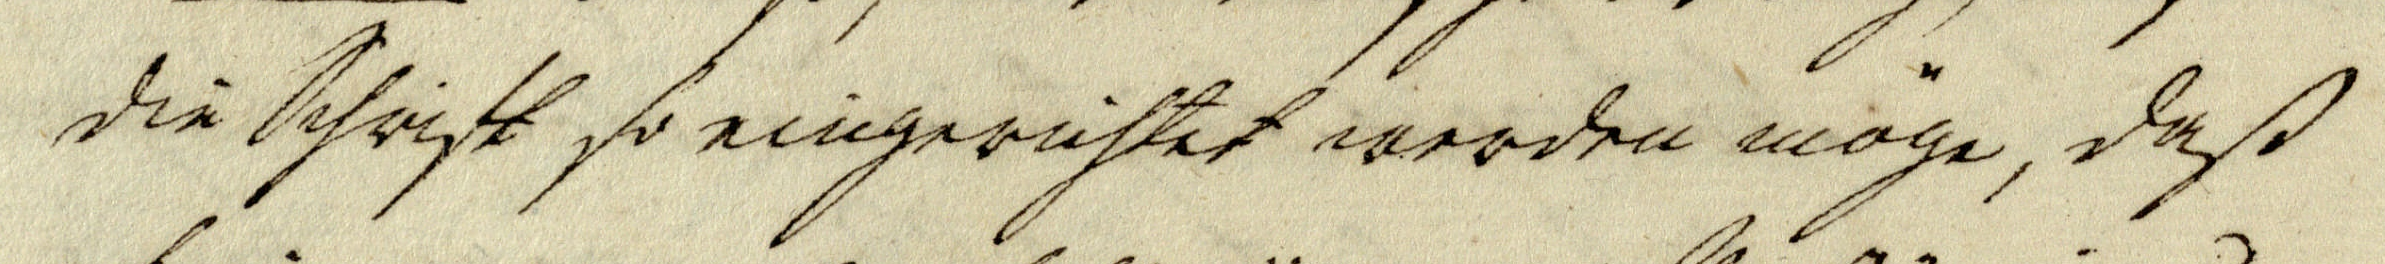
die Schrift so eingerichtet werden möge, daß
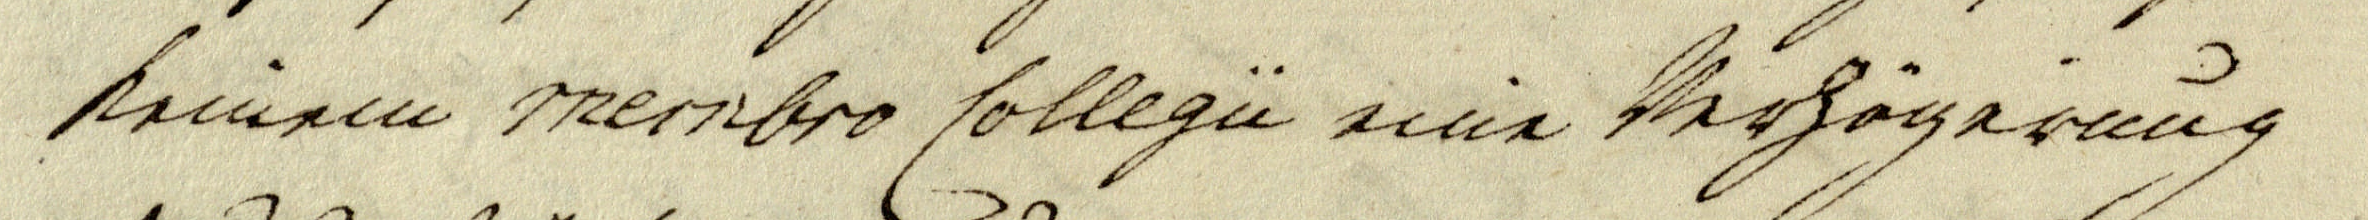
keinem membro Collegii eine Verzögerung
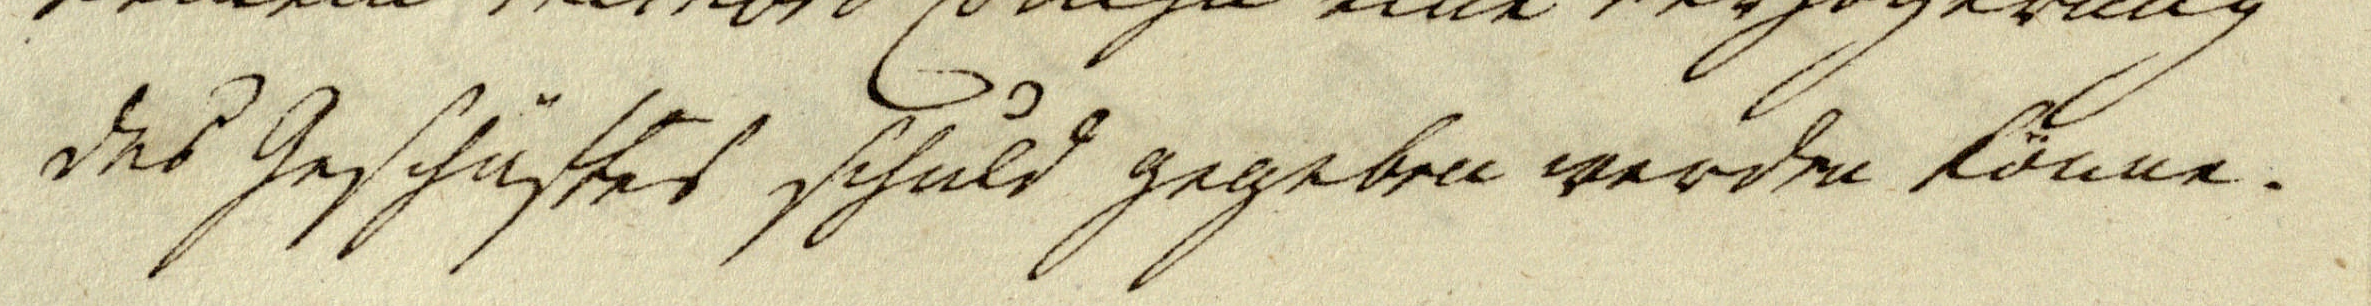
des Geschäftes schuld gegeben werden könne.
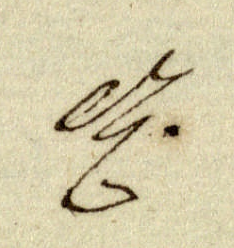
dh.
